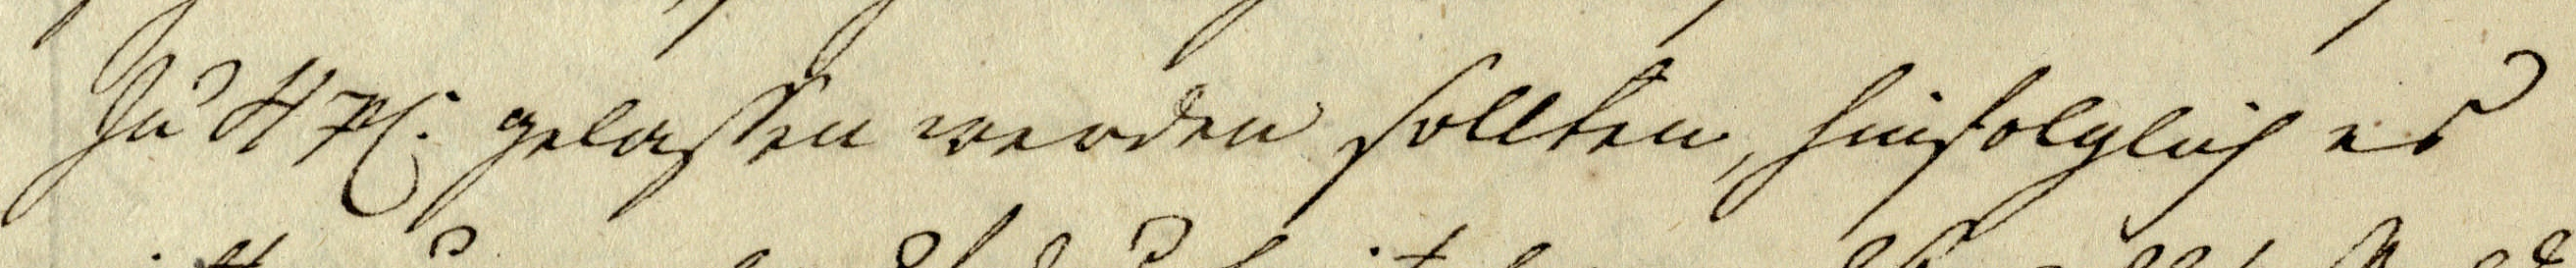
zu 4 pl. gelassen werden sollten, hinfolglich es
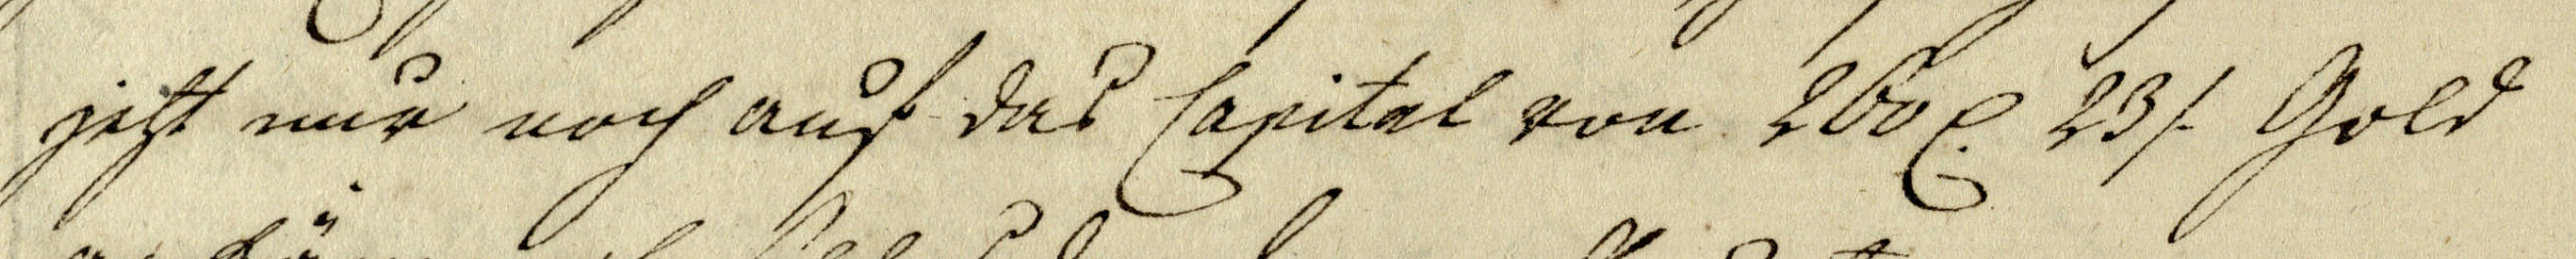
jetzt nur noch auf das Capital von 260 l. 23 s. Gold
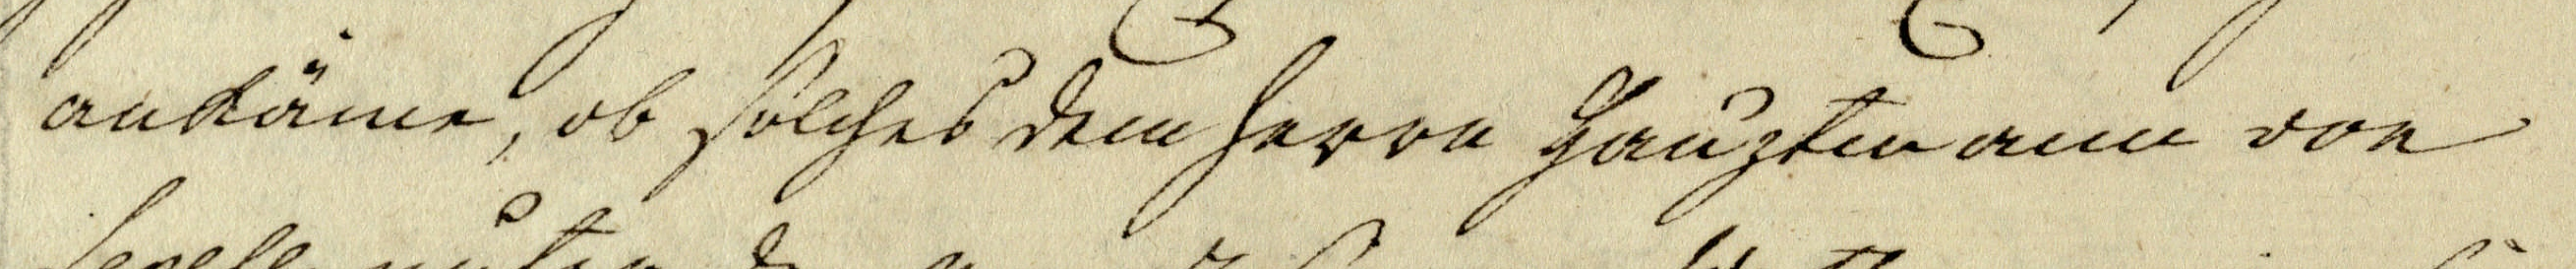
ankäme, ob solches dem Herrn Hauptmann von
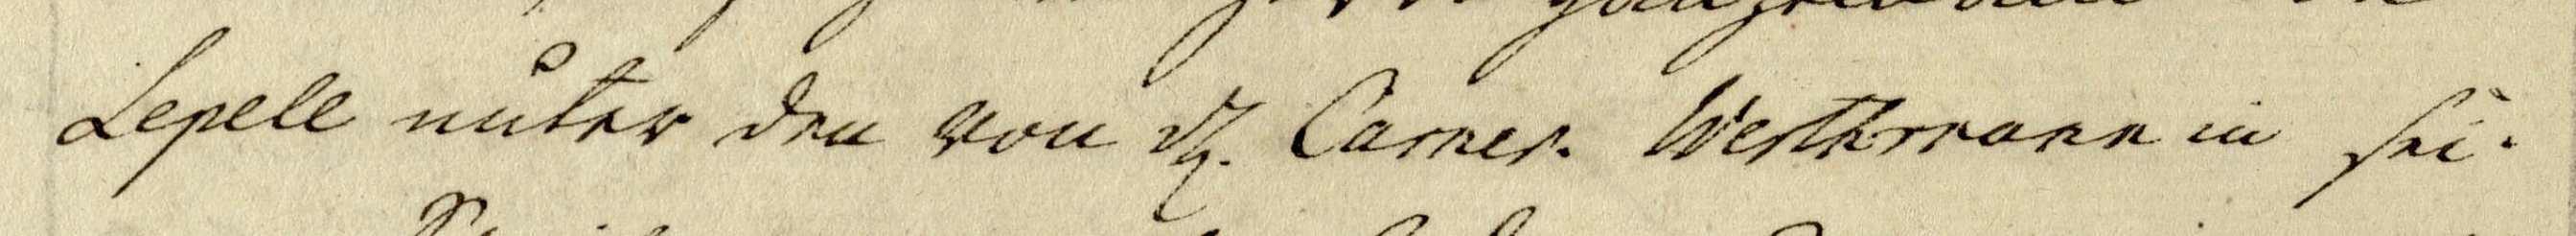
Lepell unter den von dh. Camer. Werthmann in sei¬
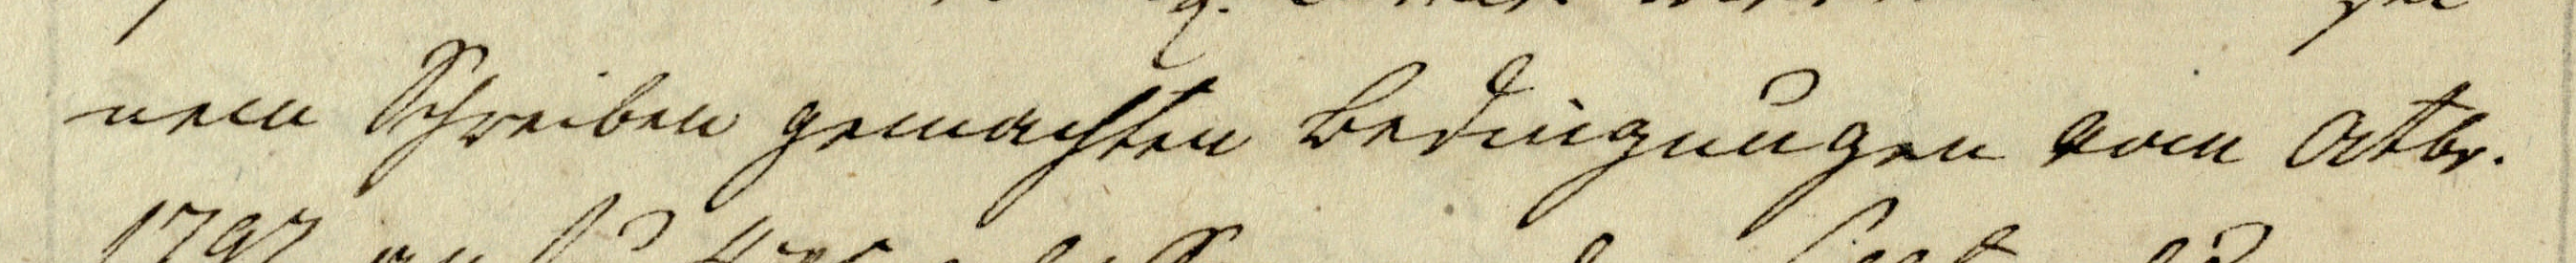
nem Schreiben gemachten Bedingungen vom Octbr.
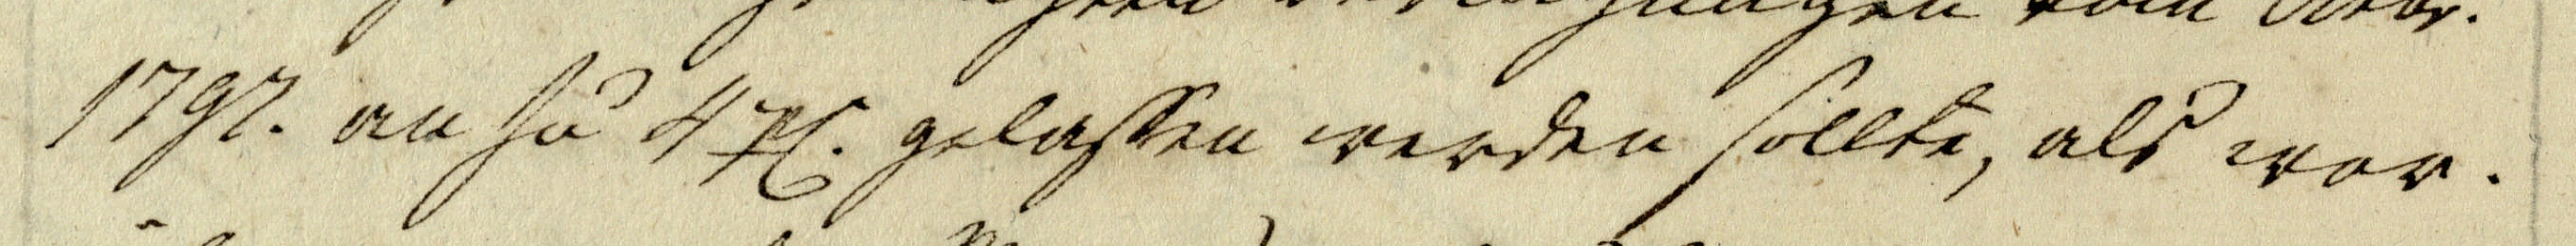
1797. an zu 4 pl. gelassen werden sollte, als wor¬
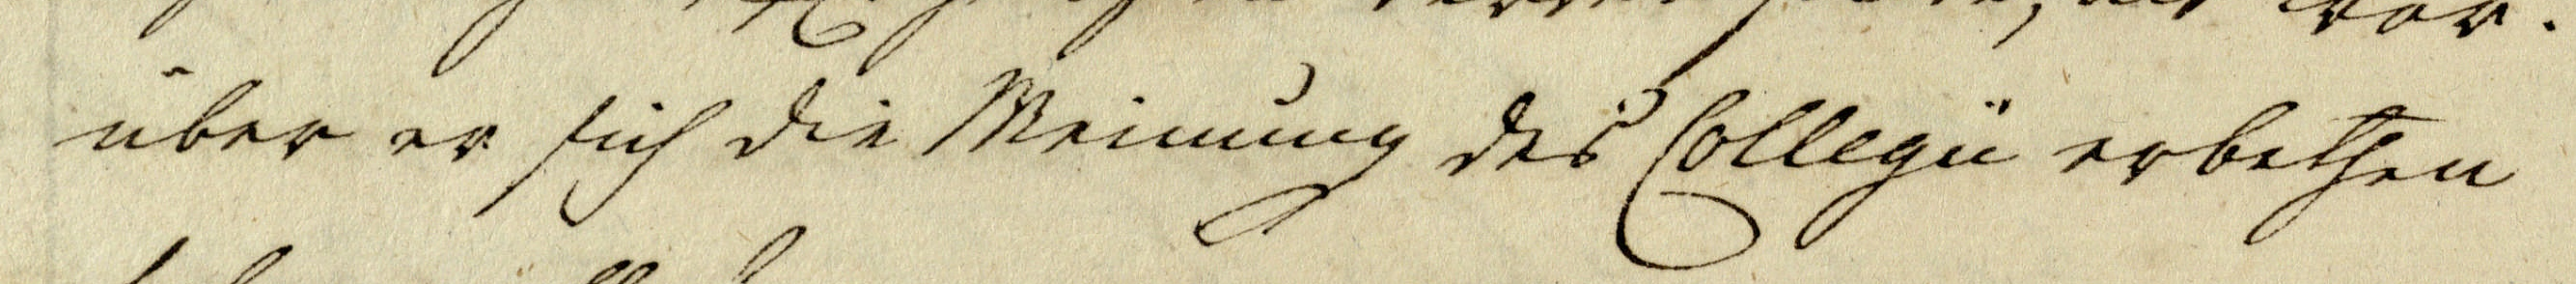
über er sich die Meinung des Collegii erbethen
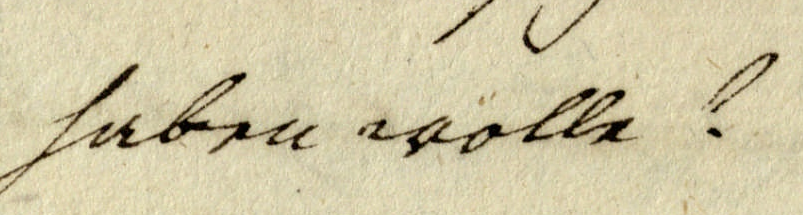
haben wolle ?
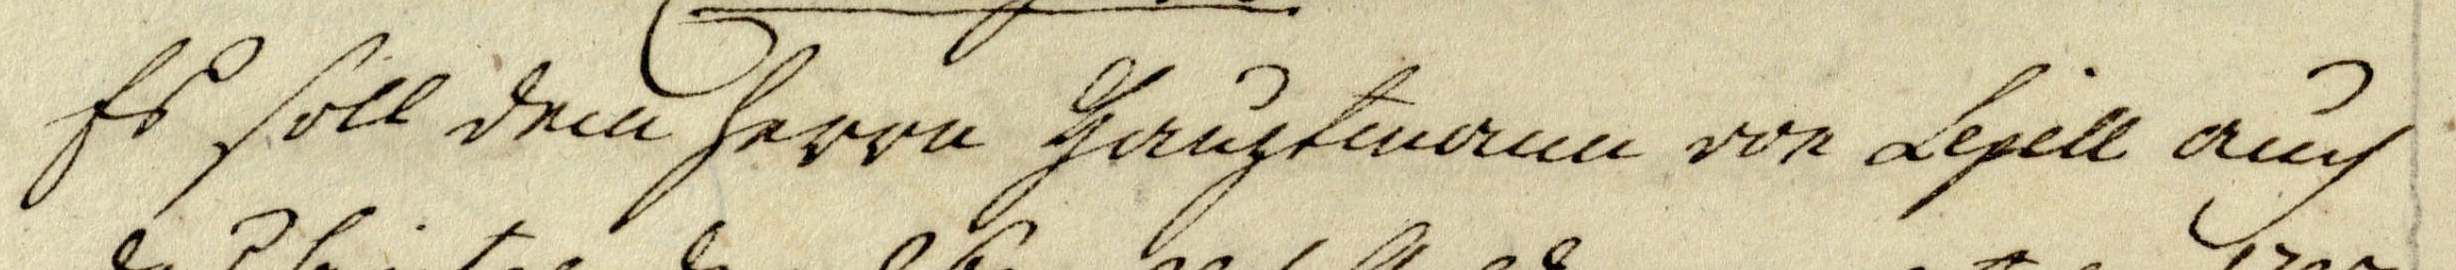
Es soll dem Herrn Hauptmann von Lepell auch
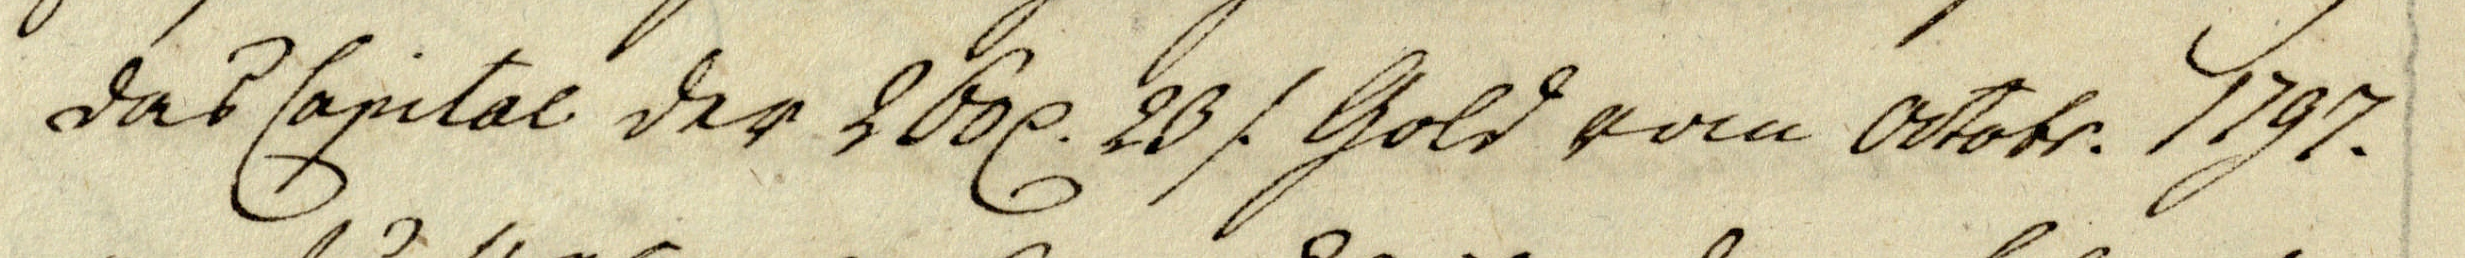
das Capital der 260 l. 23 s. Gold vom Octobr. 1797.
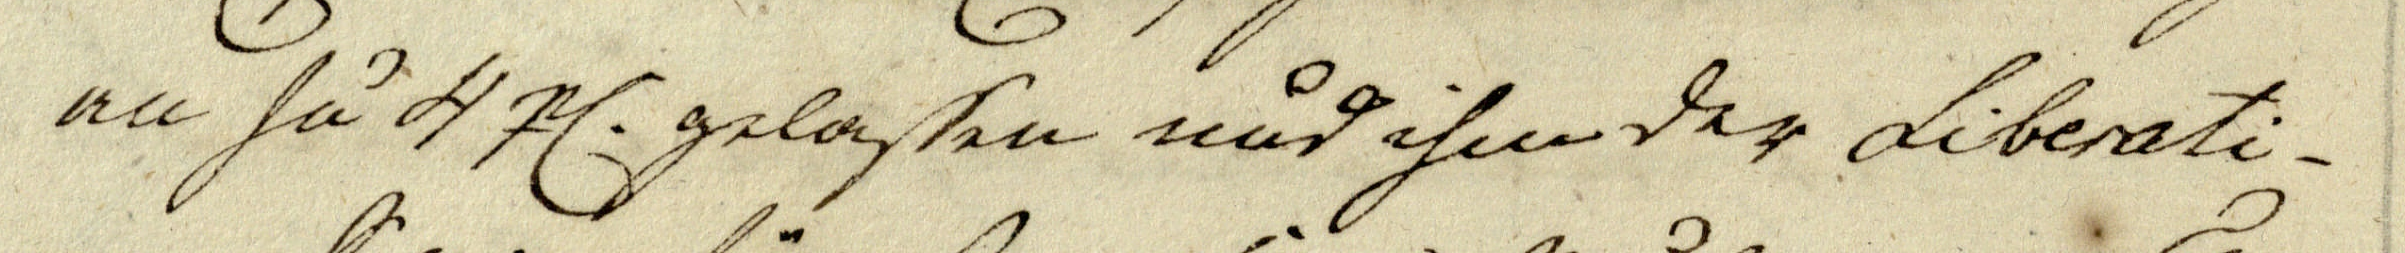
an zu 4 pl. gelassen und ihm der Liberati¬
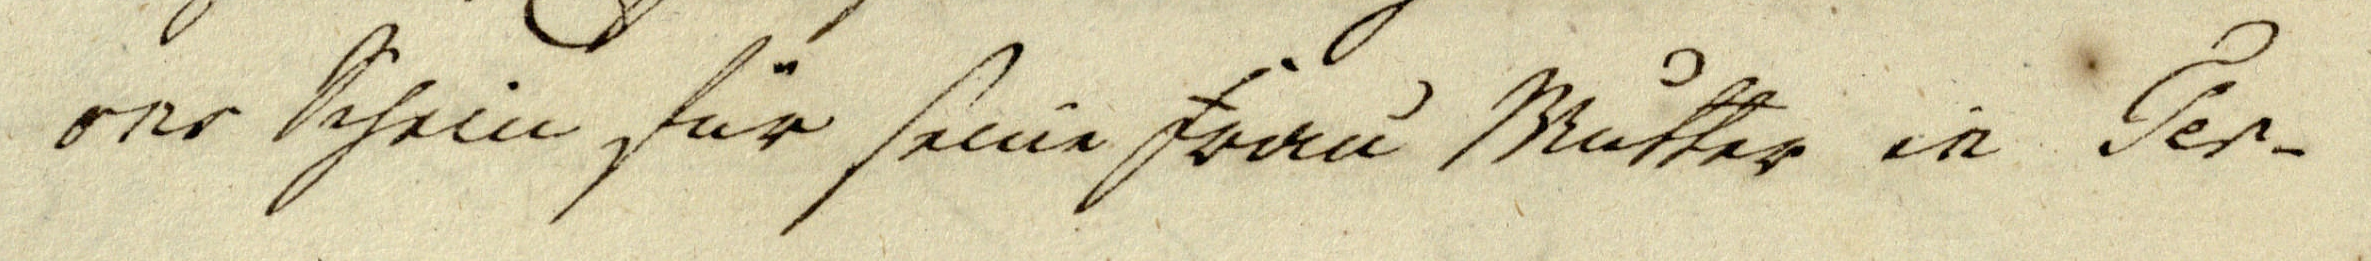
ons Schein für seine Frau Mutter in Ter¬
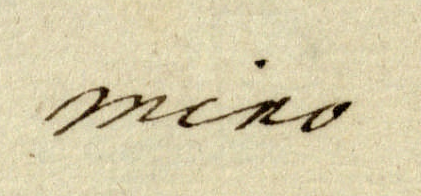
mino
